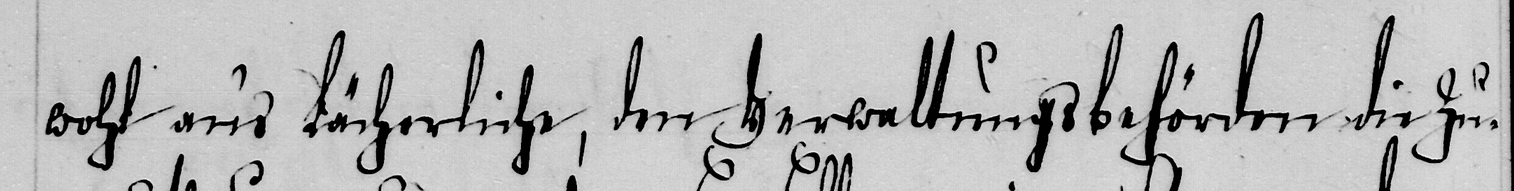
wohl an’s Lächerliche, den Verwaltungsbehörden die Zu¬
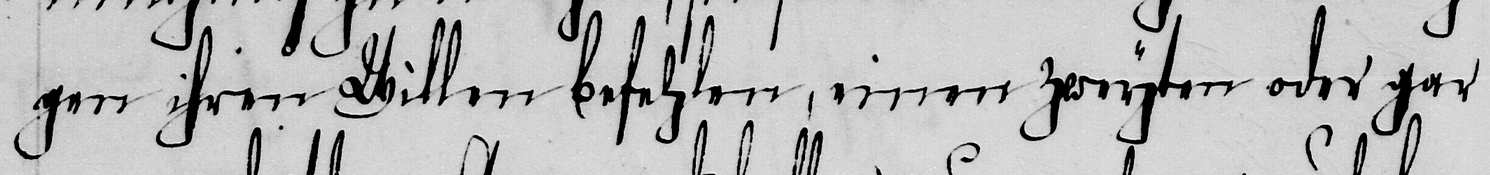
gen ihren Willen befehlen, einen zweyten oder gar
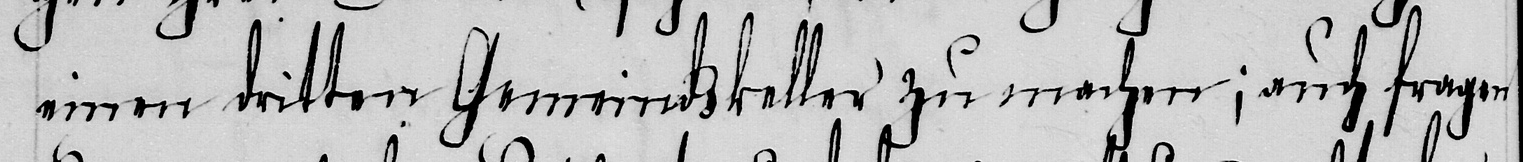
einen dritten Gemeindskeller zu machen; auch fragen
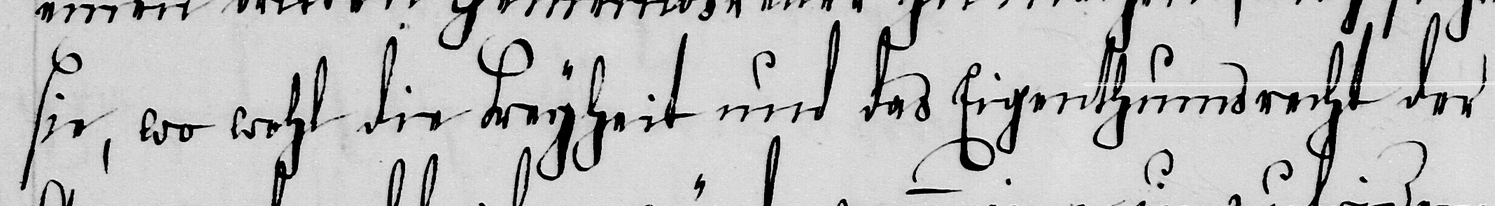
sie, wo wohl die Freyheit und das Eigenthumsrecht der
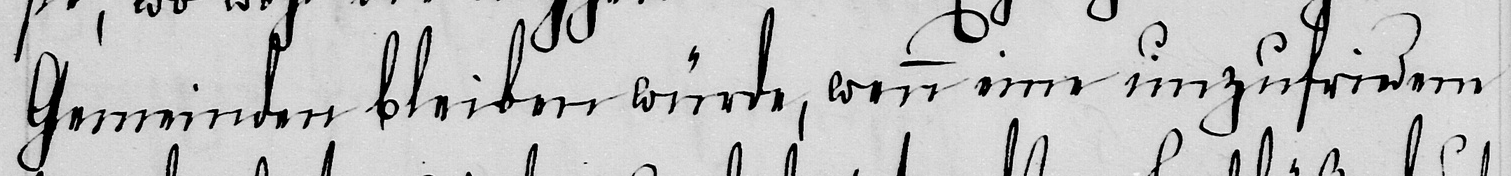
Gemeinden bleiben würde, wenn eine unzufriedene
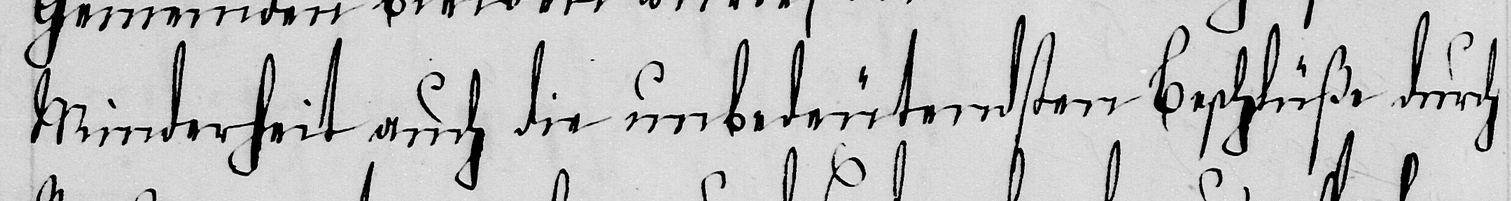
Minderheit auch die unbedeutendsten Beschlüße du¬
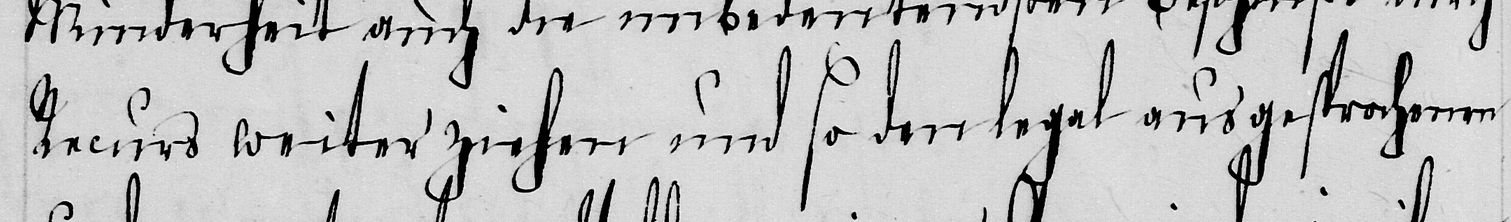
Recurs weiterziehen und so den legal ausgesprochen¬
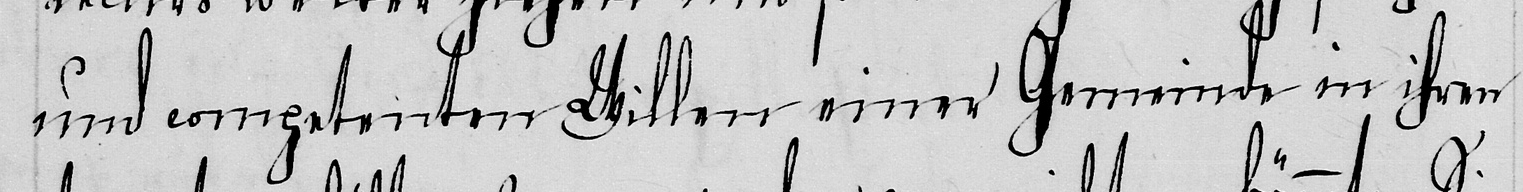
und competenten Willen einer Gemeinde in ihren
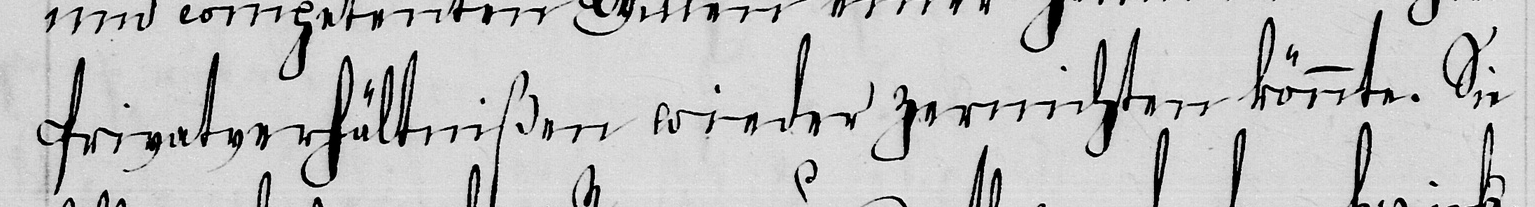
Privatverhältnißen wieder zernichten könnte. Sie
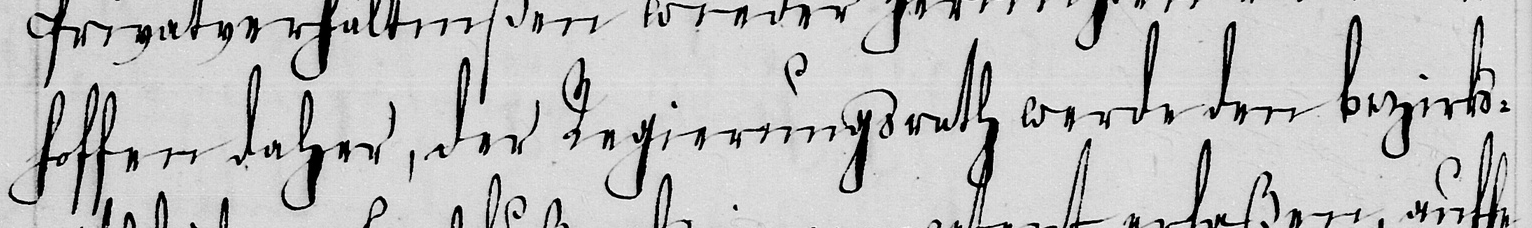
hoffen daher, der Regierungsrath werde den bezirks¬
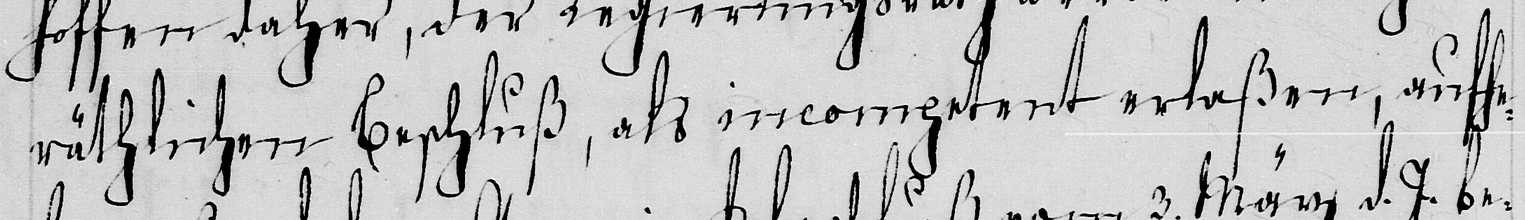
räthlichen Beschluß, als incompetent erlaßen, aufh¬
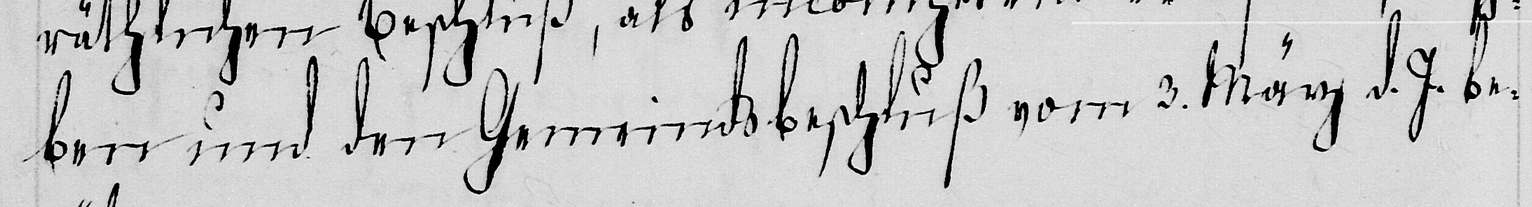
eben und den Gemeindsbeschluß vom 3. März d. J.
